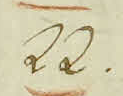22
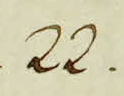22
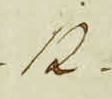12
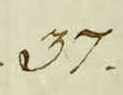37
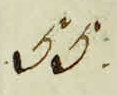55
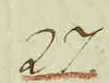27
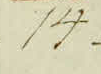14
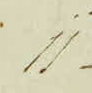11
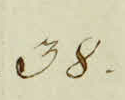38
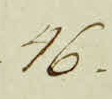46
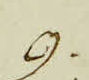9
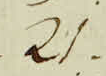21
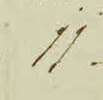11
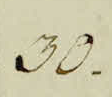30
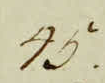45
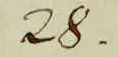28
